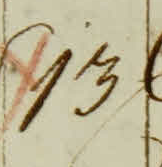13
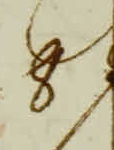8
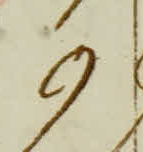9
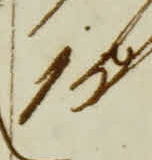15
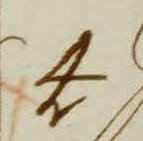4
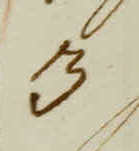3
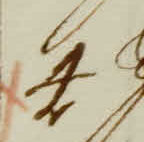4
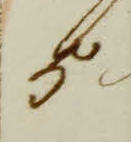5
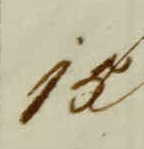15
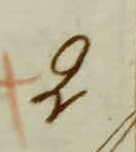2
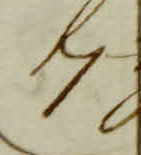7
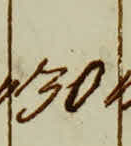30
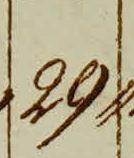29
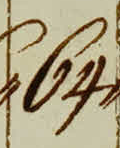64
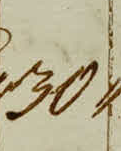30
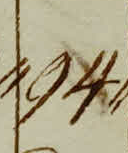94
